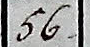56
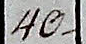40
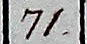71
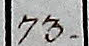73
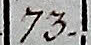73
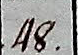48
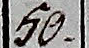50
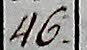46
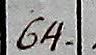64
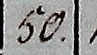50.
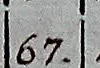67.
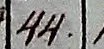44.
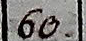60
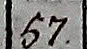57
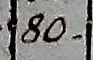80
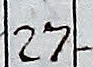27
